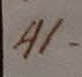41
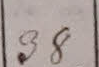38
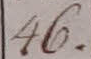46
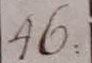46
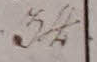34
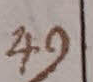49
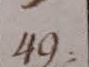49
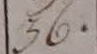36
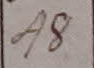48
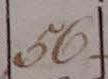56
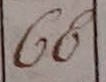66
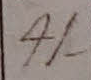41
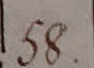58
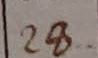28
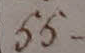55
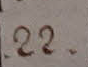22
